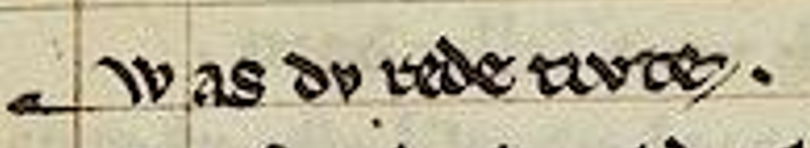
Was dv rede tivte.
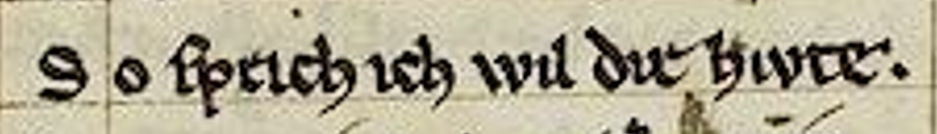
So ſprich ich wil dir hivte.
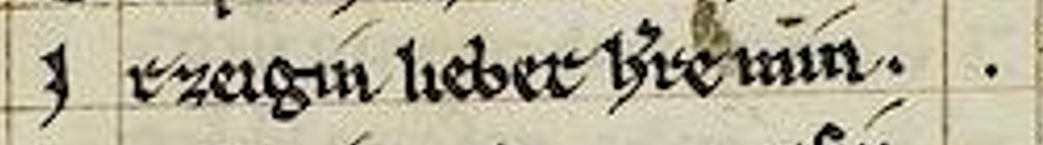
Irzeigin lieber h(er)re min.
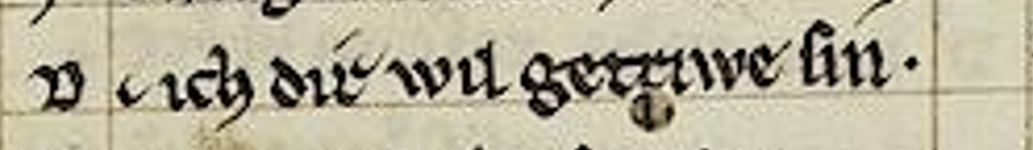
D(az) ich dir wil getriwe ſin.
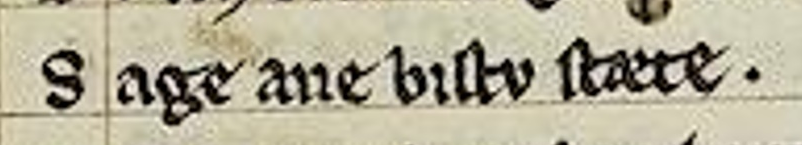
Sage ane biſtv ſt[ae]te.
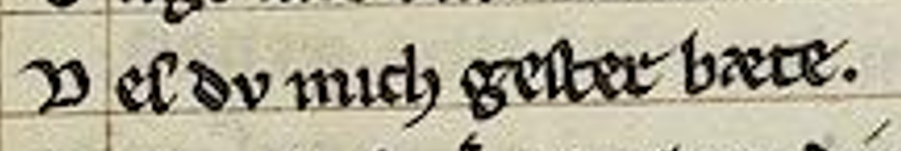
Deſ dv mich geſter b[ae]te.
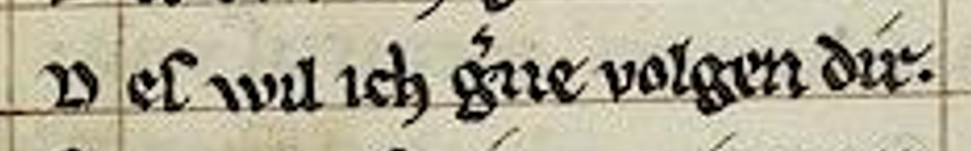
Deſ wil ich g(er)ne volgen dir.
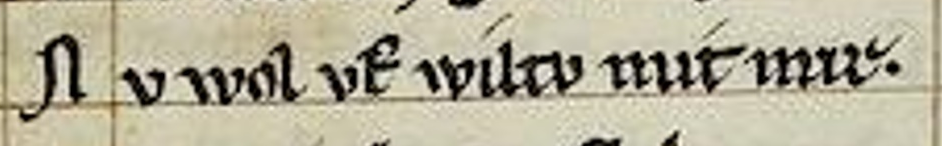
Nv wol vf wiltv mit mir.
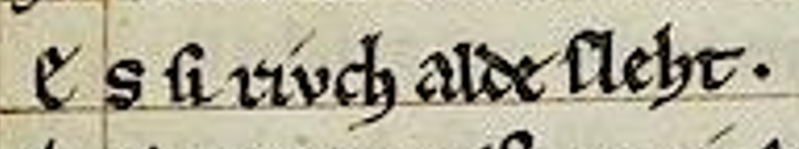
Es ſi rivch alde ſleht.
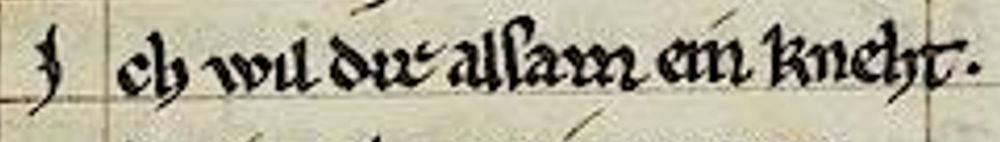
Ich wil dir alſam ein kneht.
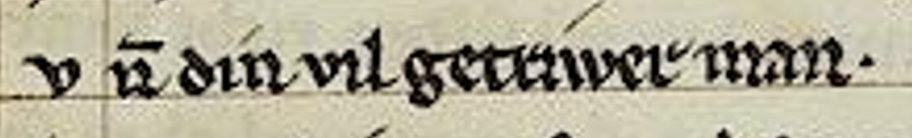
Vn(d) din vil getriwer man.
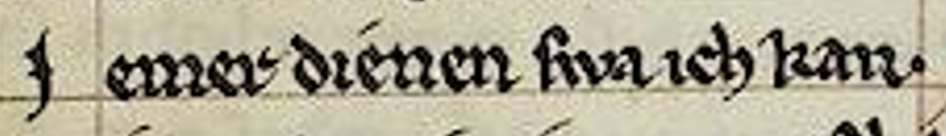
Iemer dienen ſwa ich kan.
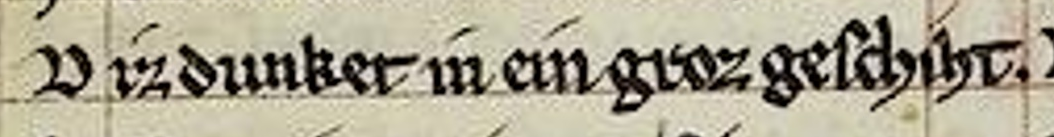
Diz dunket in ein groz geſchiht.
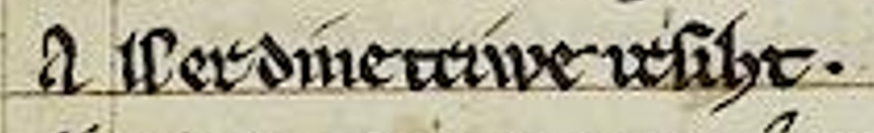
Alſ er dine triwe irſiht.
